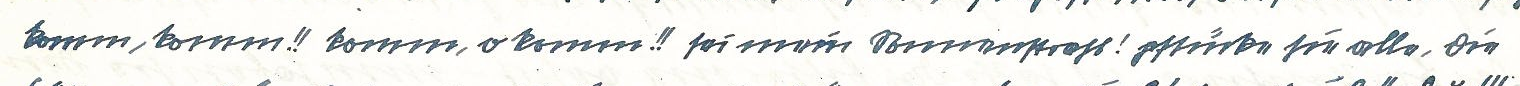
komm, komm!! Komm, o komm!! Sei mein Sonnenstrahl! Pflücke sie alle, die
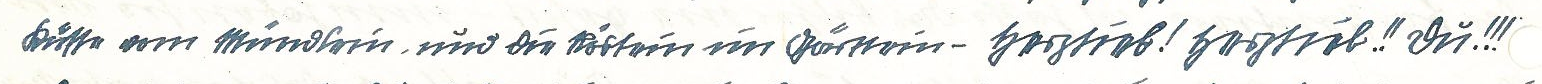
Küsse vom Mündlein, und die Röslein im Gärtlein– Herzlieb! Herzlieb!! Du!!!
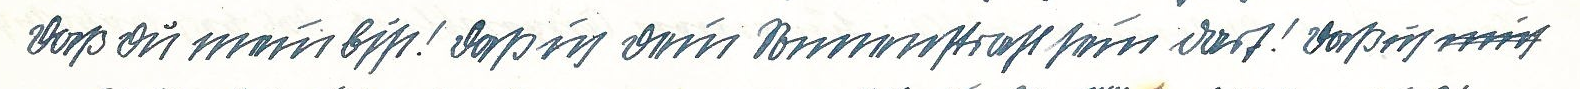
Daß Du mein bist! Daß ich Dein Sonnenstrahl sein darf! Daß ich mich
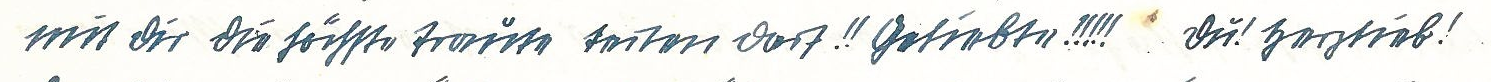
mit Dir die höchste Traute teilen darf!! Geliebte!!!!! Du! Herzlieb!
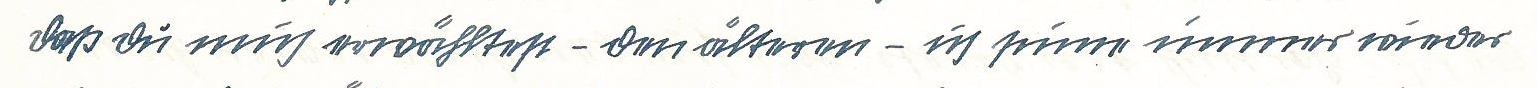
Daß Du mich erwähltest – den älteren – ich sinne immer wieder
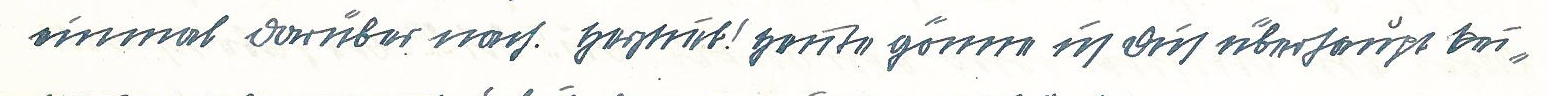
einmal darüber nach. Herzlieb! Heute gönne ich Dich überhaupt kei¬
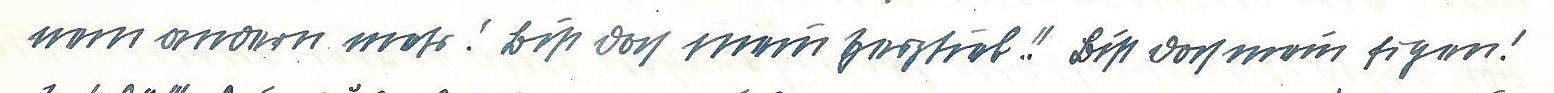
nem andern mehr! Bist doch mein Herzlieb!! Bist doch mein Eigen!
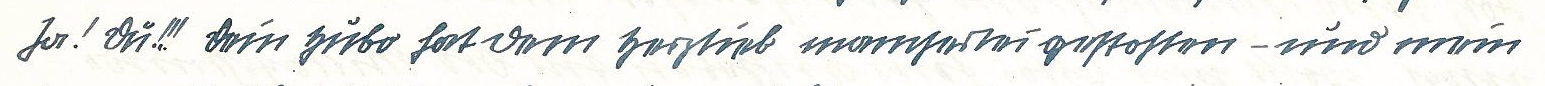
Ja! Du!!! Dein Hubo hat dem Herzlieb mancherlei gestohlen – und mein
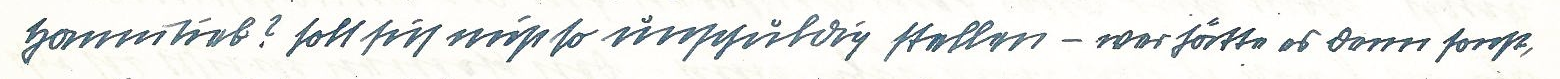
lieb? Soll sich nicht so unschuldig stellen – wer hätte es denn sonst,
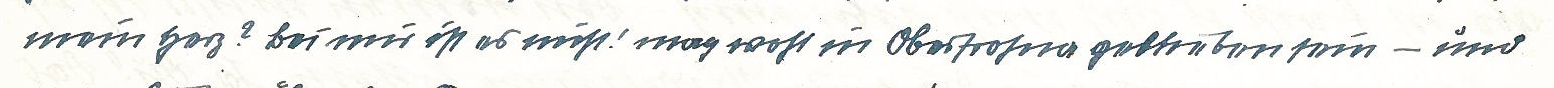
mein Herz? Bei mir ist es nicht! mag wohl in O. geblieben sein – und
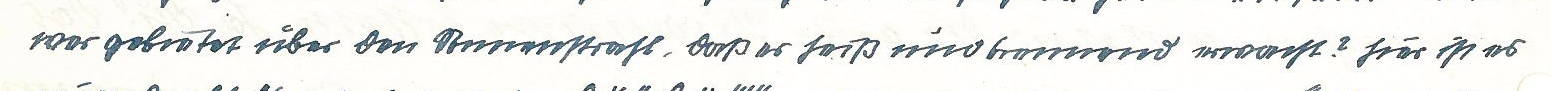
wer gebietet über den Sonnenstrahl, daß er heiß und brennend erwacht? Hier ist es
